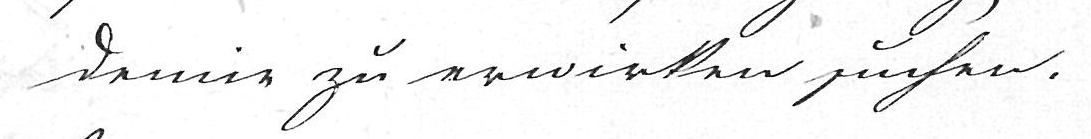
demie zu erwirken suchen.
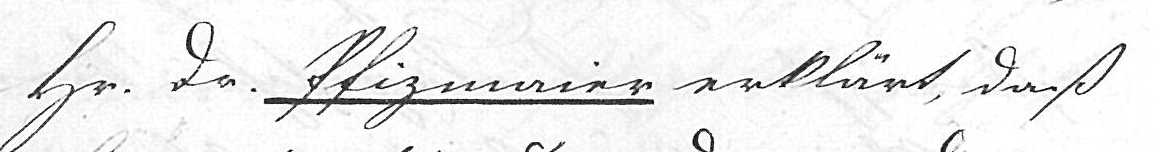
Hr. Dr. Pfizmaier erklärt, daß
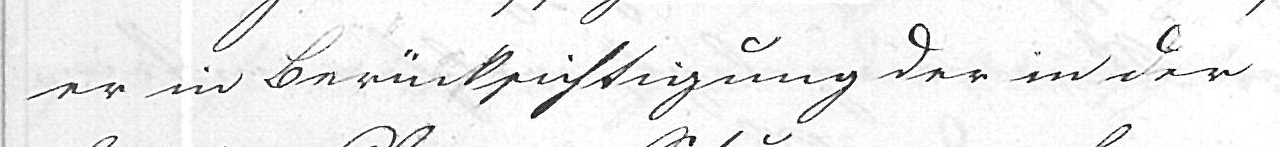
er in Berücksichtigung der in der
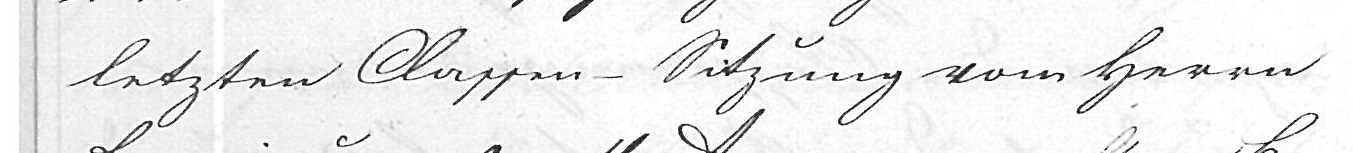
letzten Classen-Sitzung vom Herrn
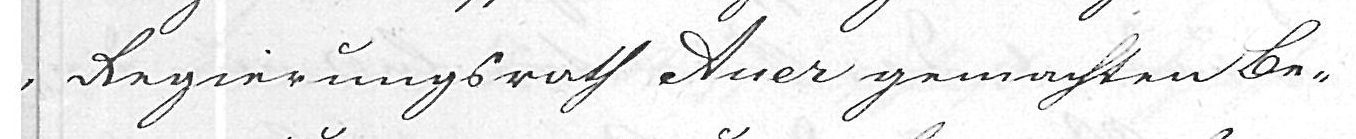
Regierungsrath Auer gemachten Be-
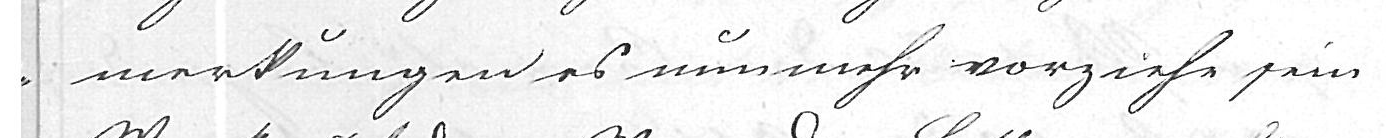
merkungen es nunmehr vorziehe, sein
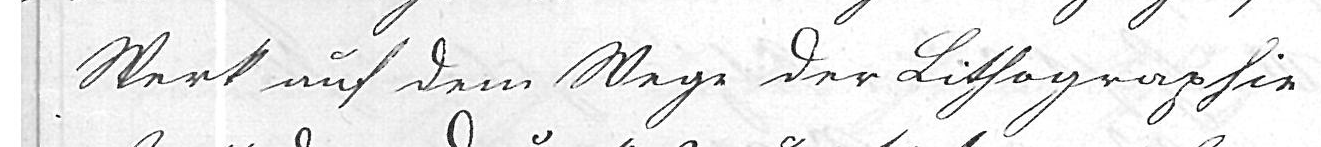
Werk auf dem Wege der Lithographie
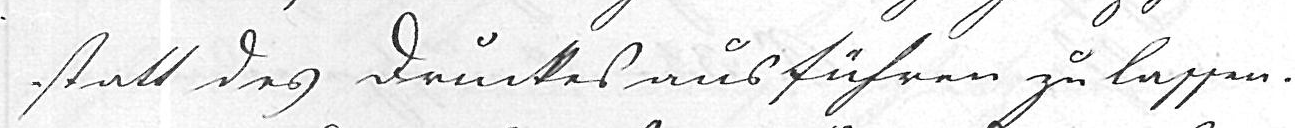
statt des Druckes ausführen zu lassen.
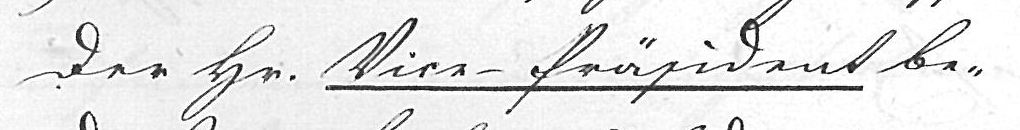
Der Hr. Vice-Präsident be-
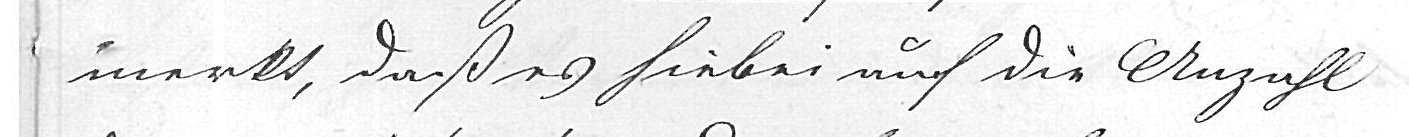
merkt, daß es hiebei auf die Anzahl
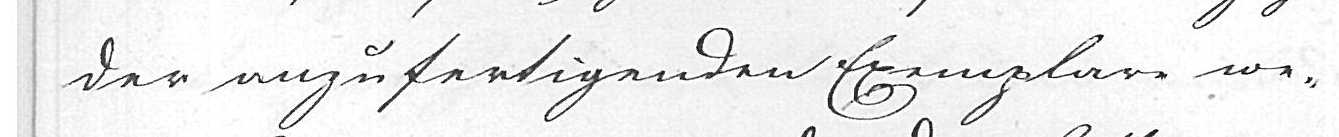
der auszufertigenden Exemplare we-
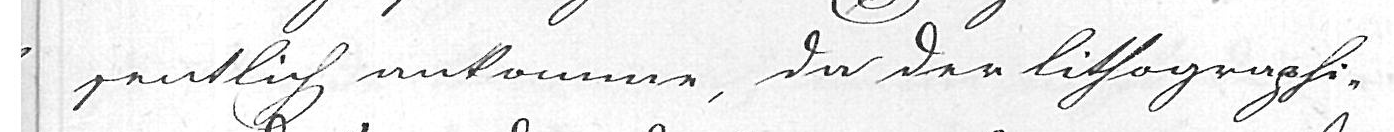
sentlich ankomme, da der lithographi-
